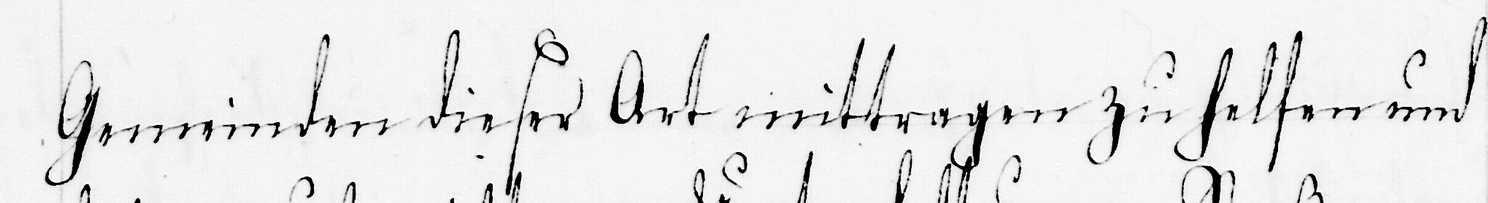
Gemeinden dieser Art mittragen zu helfen und
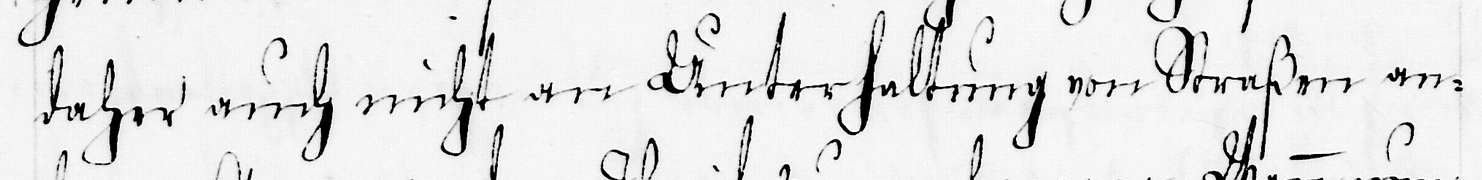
daher auch nicht an Unterhaltung von Straßen an¬
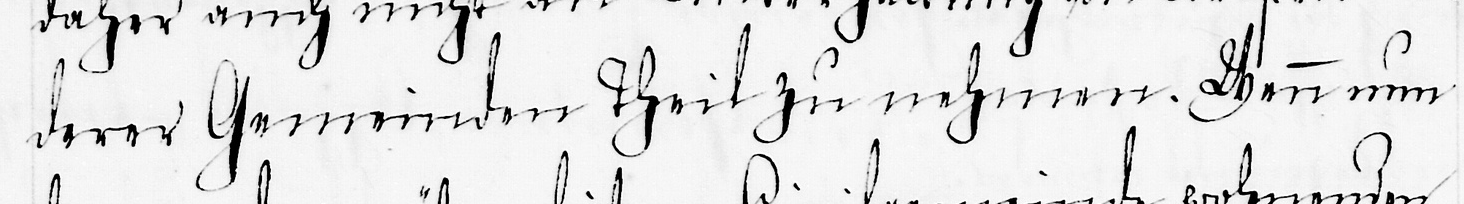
derer Gemeinden Theil zu nehmen. Wenn nun
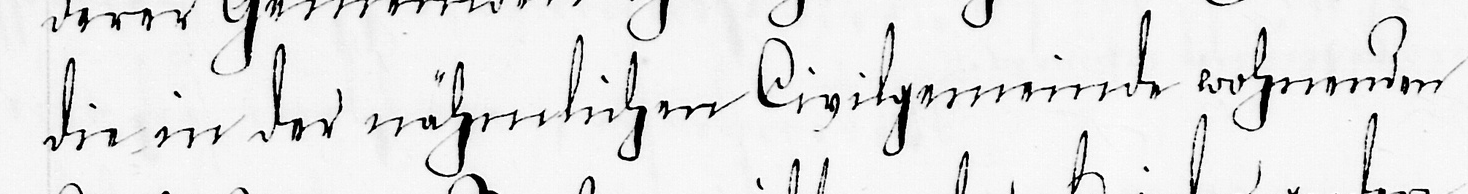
die in der nähmlichen Civilgemeinde wohnenden
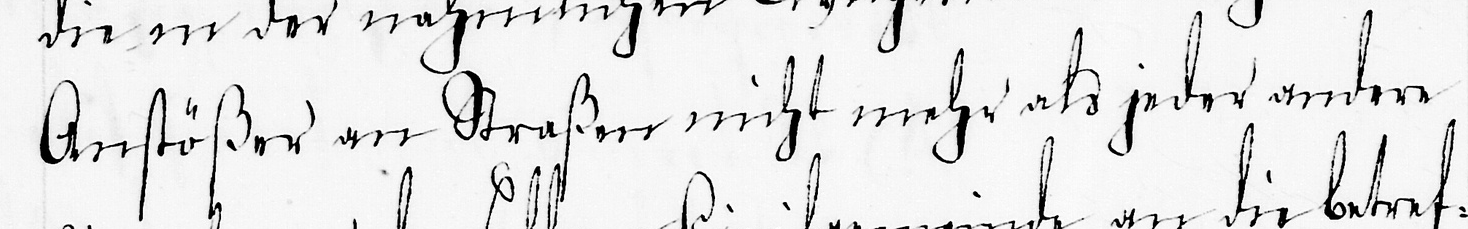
Anstößer an Straßen nicht mehr als jeder andere
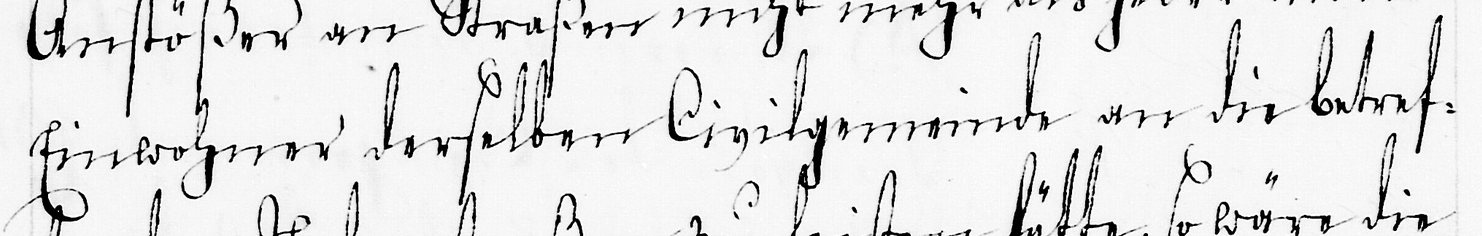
Einwohner derselben Civilgemeinde an die betref¬
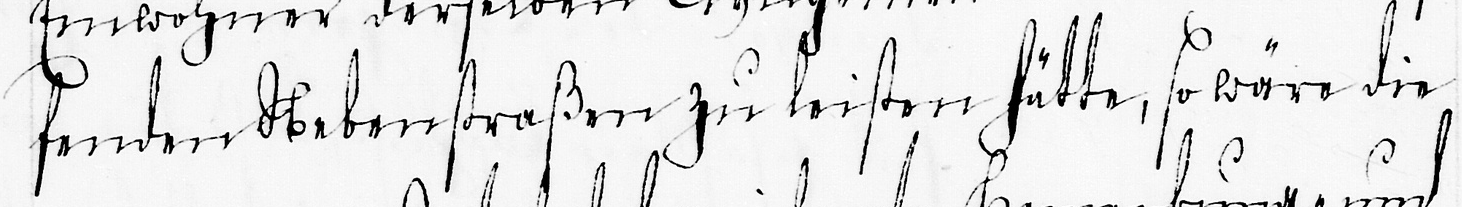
fenden Nebenstraßen zu leisten hätte, so wäre die
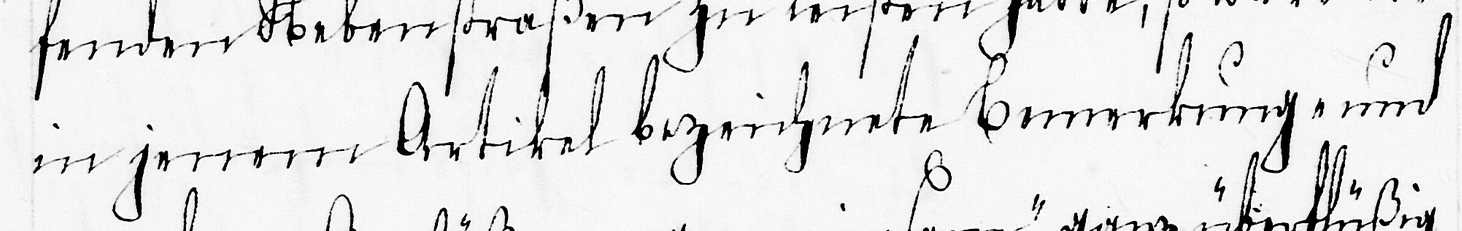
in jenem Artikel bezeichnete Bemerkung „und
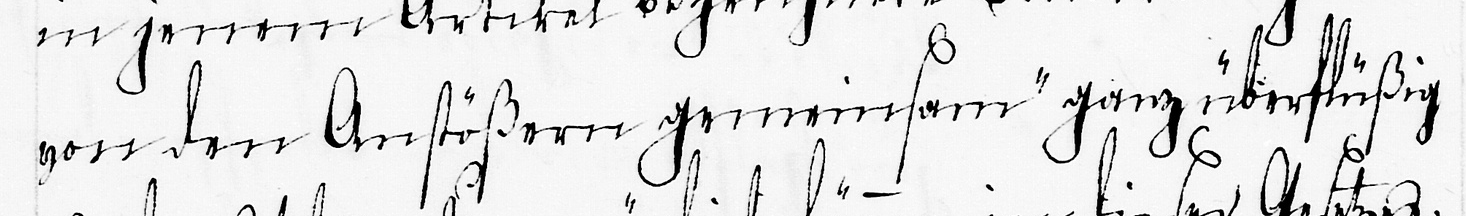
von den Anstößern gemeinsam“ ganz überflüßig
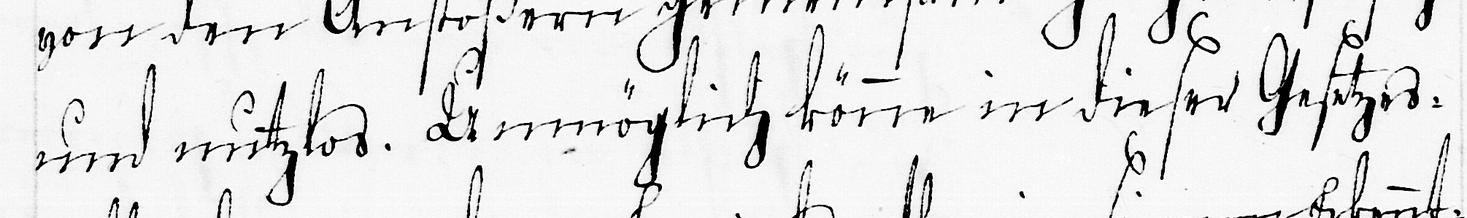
und nutzlos. Unmöglich könne in dieser Gesetzes¬
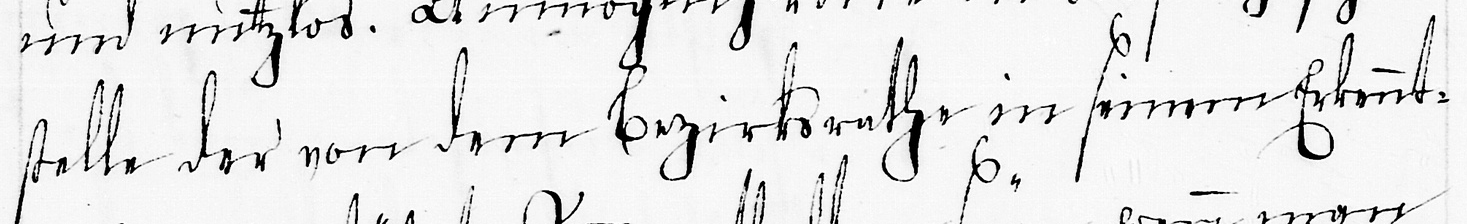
stelle der von dem Bezirksrathe in seinem Erkennt¬
